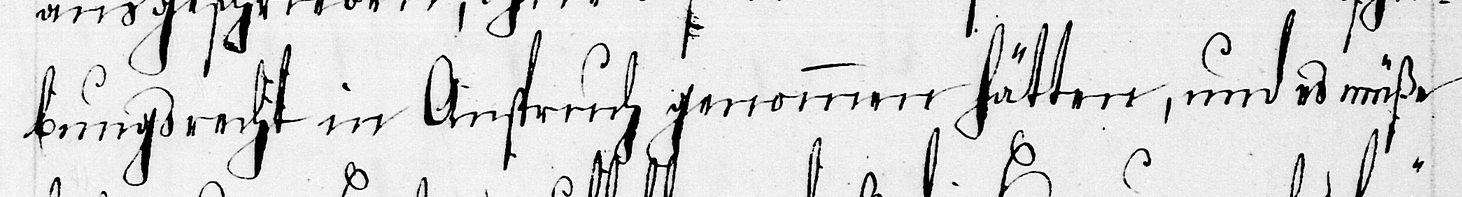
bungsrecht in Anspruch genommen hätten, und es müße
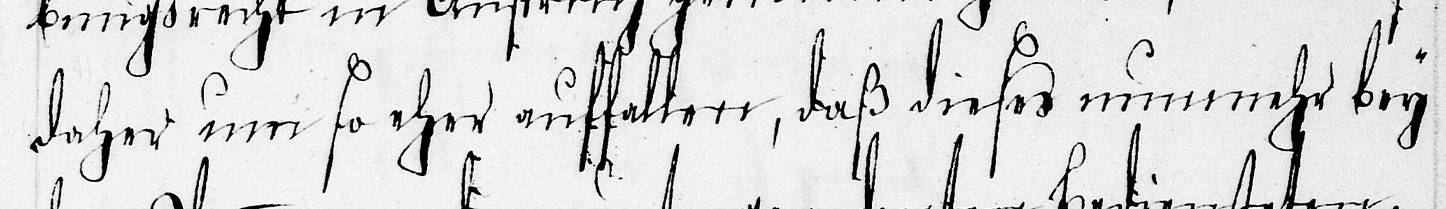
daher um so eher auffallen, daß dieses nunmehr bey
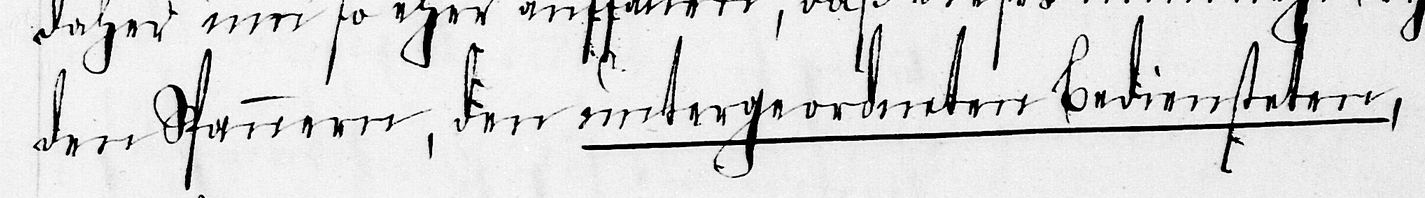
den Spannern, den untergeordneten Bediensteten,
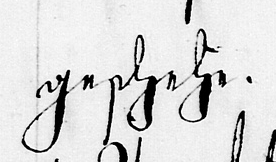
geschehe.
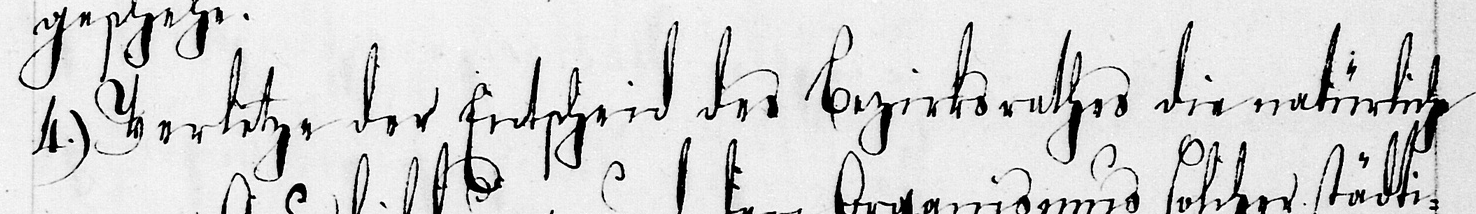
4.) Verletze der Entscheid des Bezirksrathes die natürliche
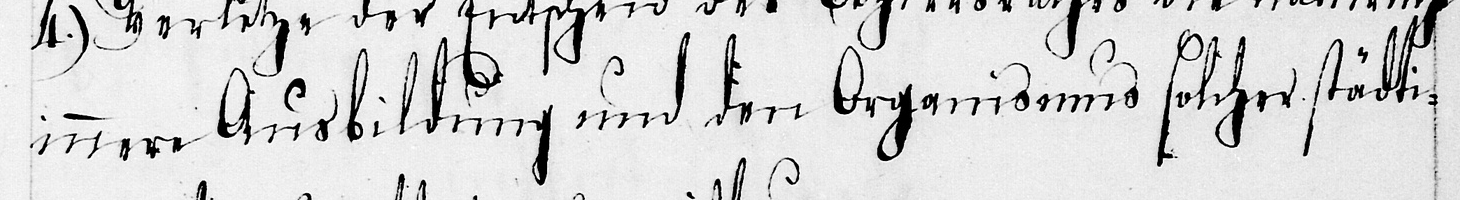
innere Ausbildung und den Organismus solcher städti¬
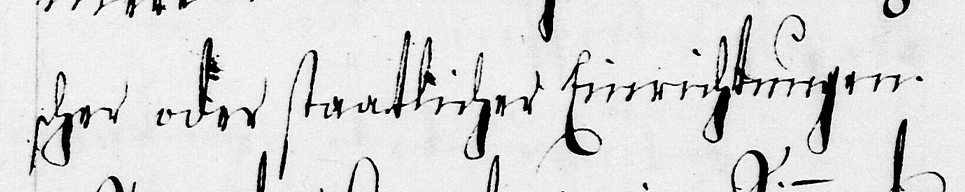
scher oder staatlicher Einrichtungen.
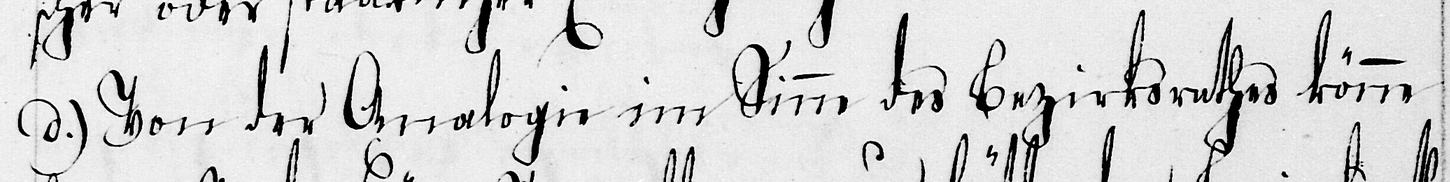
d.) Von der Analogie im Sinne des Bezirksrathes könne
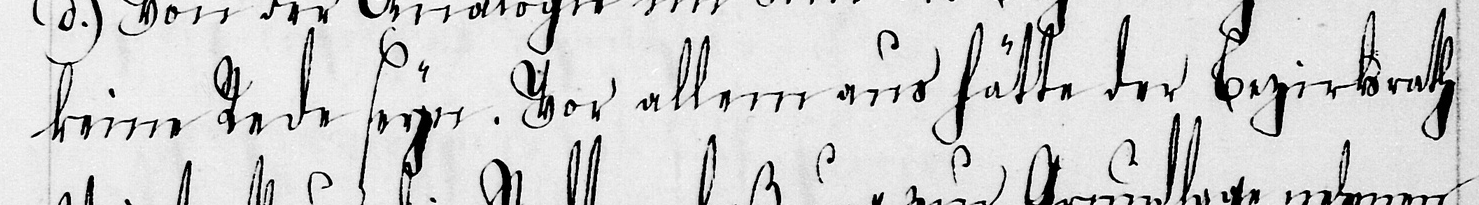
keine Rede seyn. Vor allem aus hätte der Bezirksrath
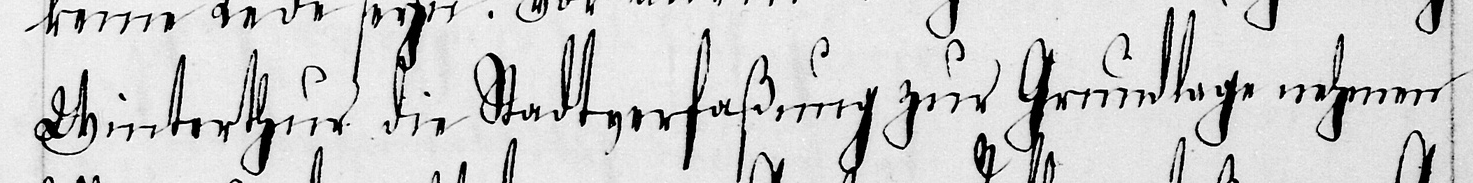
Winterthur die Stadtverfaßung zur Grundlage nehmen
